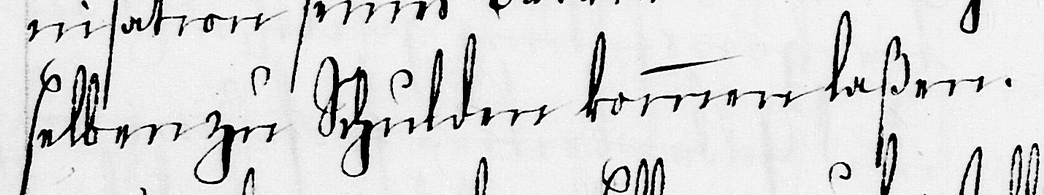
selben zu Schulden kommen laßen.
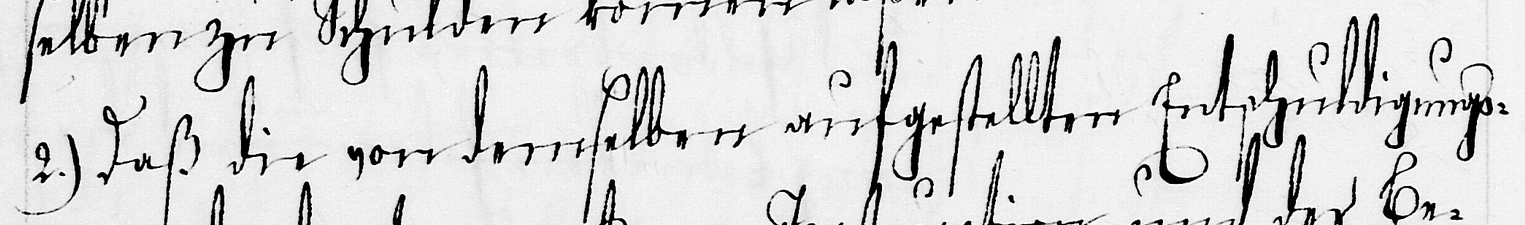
2.) Daß die von demselben aufgestellten Entschuldigun¬
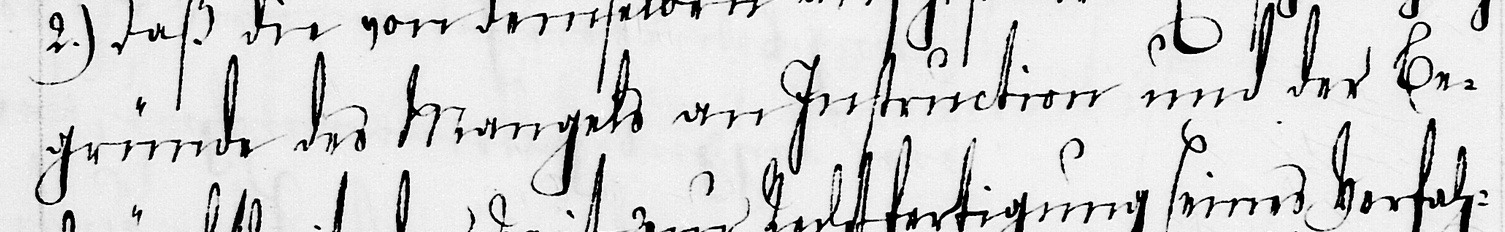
gründe des Mangels an Instruction und der Be¬
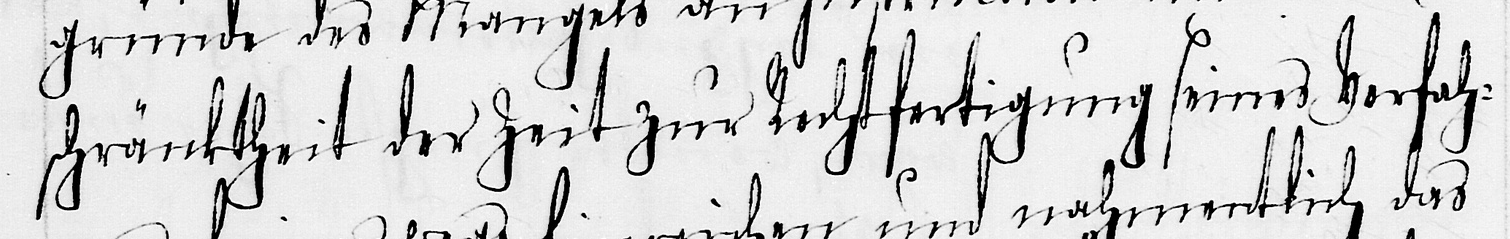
schränktheit der Zeit zur Rechtfertigung seines Verfah¬
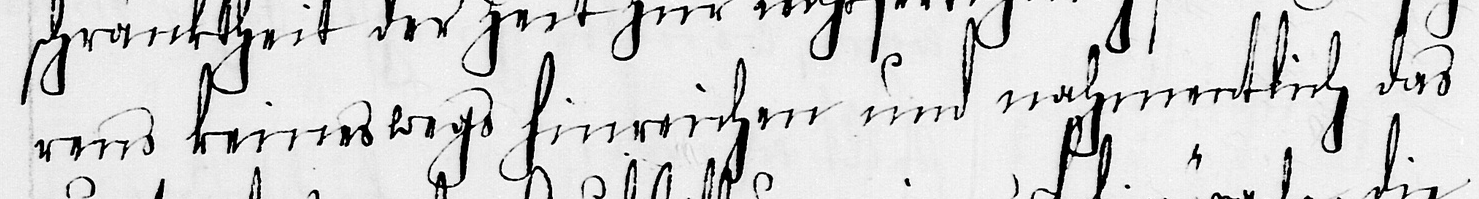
rens keineswegs hinreichen und nahmentlich das
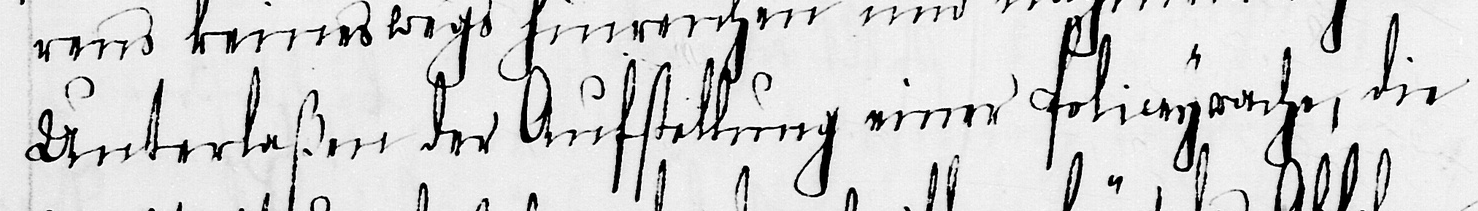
Unterlaßen der Aufstellung einer Policeywache, die
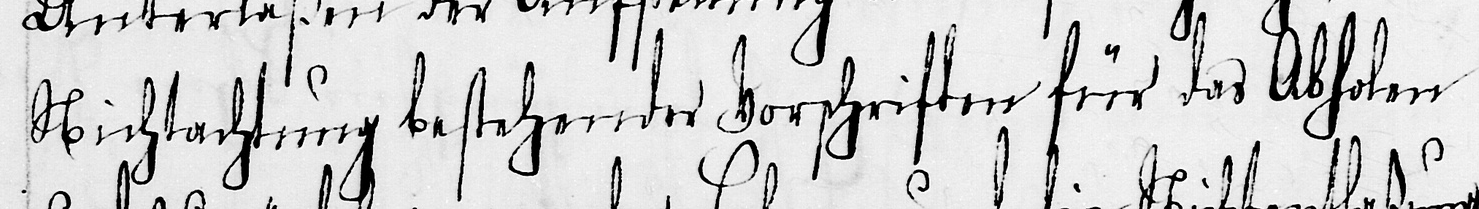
Nichtachtung bestehender Vorschriften für das Abholen
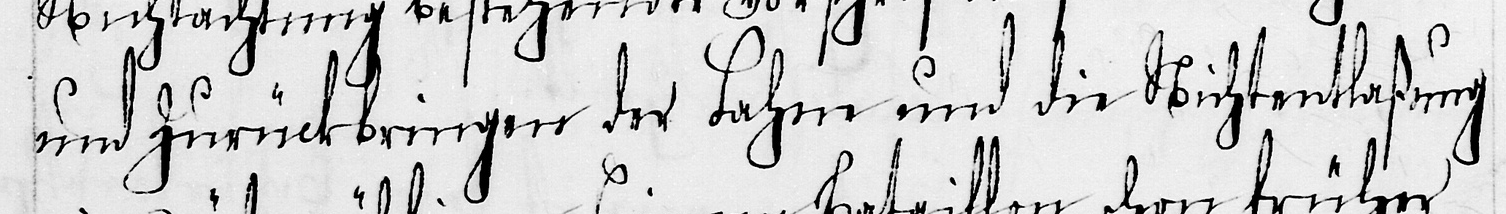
und Zurückbringen der Fahne und die Nichtentlaßung
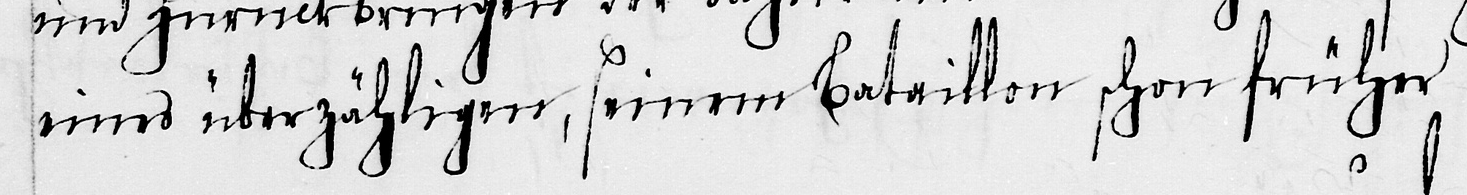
eines überzähligen, seinem Bataillon schon früher
